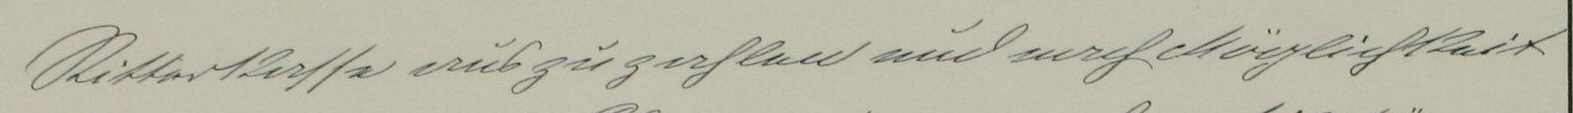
Ritterkasse auszuzahlen und nach Möglichkeit
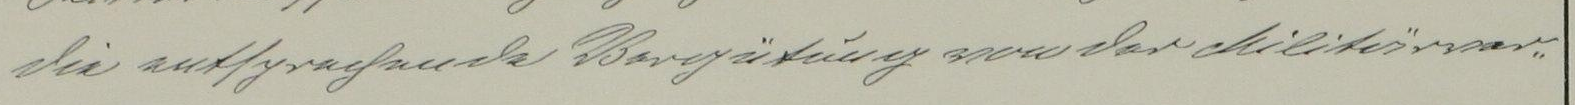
die entsprechende Vergütung von der Militärver-
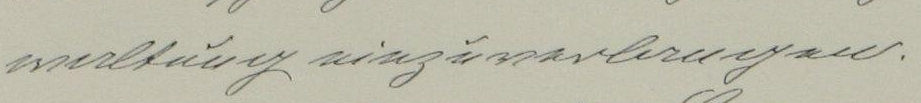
waltung einzuverlangen.
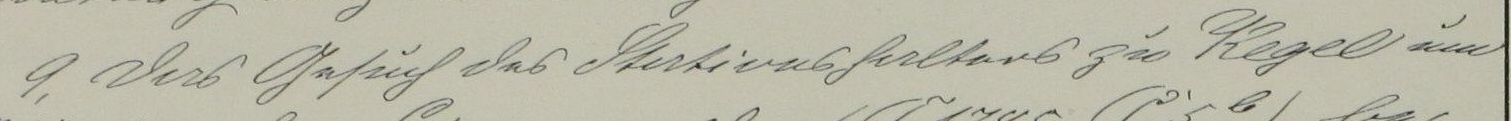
9. Das Gesuch des Stationshalters zu Kegel um
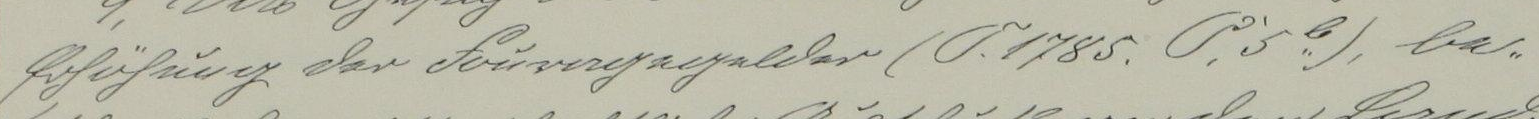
Erhöhung der Fouragegelder (T.1785. P.5b) be-
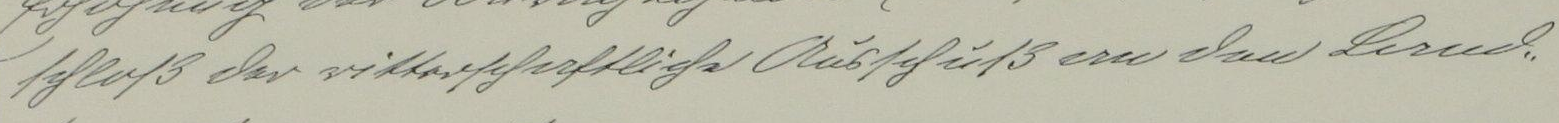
schloß der ritterschaftliche Ausschuß an den Land-
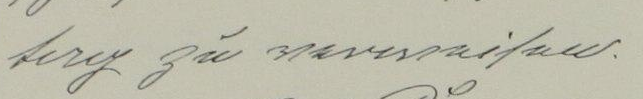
tag zu verweisen.
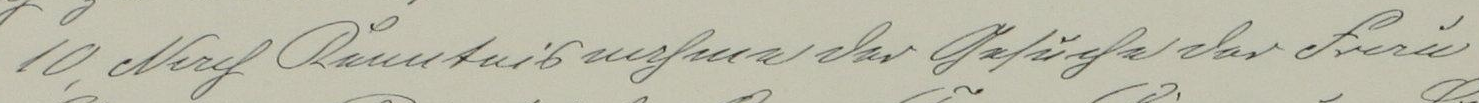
10. Nach Kenntnisnahme der Gesuche der Frau
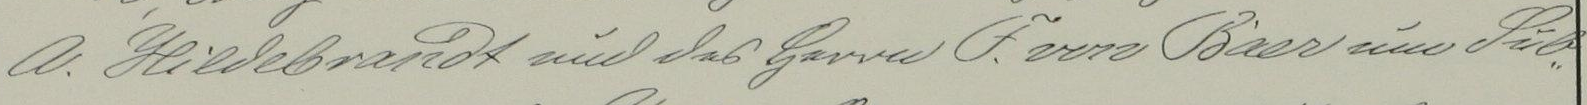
A. Hildebrandt und des Herrn F. von Baer um Sub-
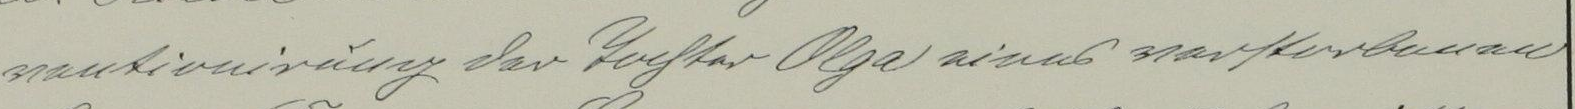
ventionirung der Tochter Olga eines verstorbenen
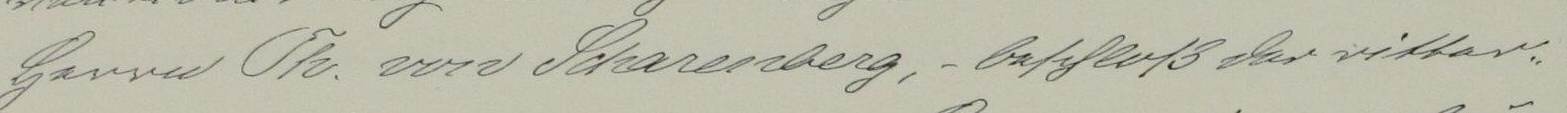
Herrn Th. von Scharenberg, - beschloß der ritter-
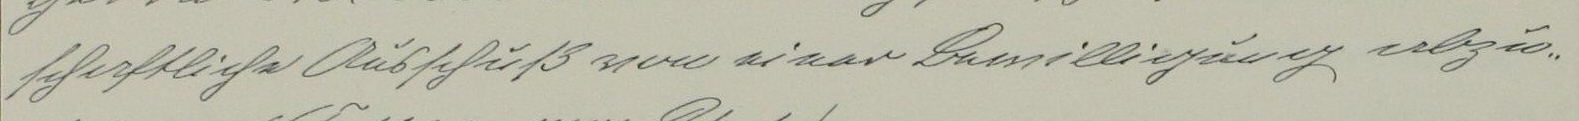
schaftliche Ausschuß von einer Bewilligung abzu-
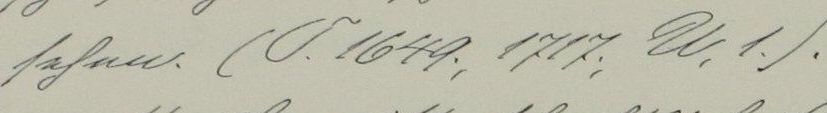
sehen. (T.1649; 1717; U.1).
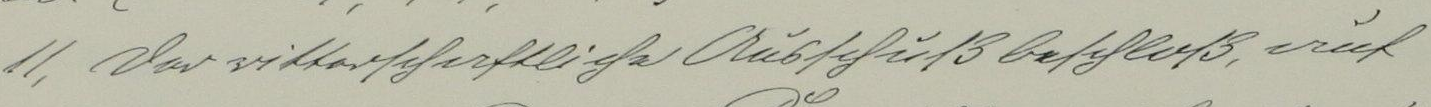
11. Der ritterschaftliche Ausschuß beschloß, auf
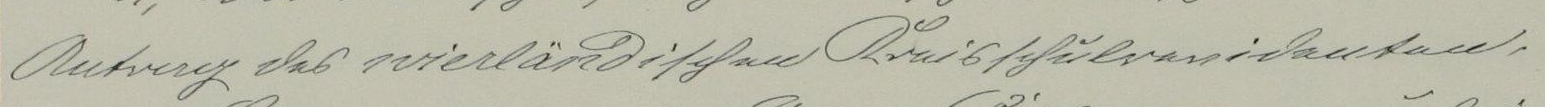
Antrag des wierländischen Kreisschulrevidenten,
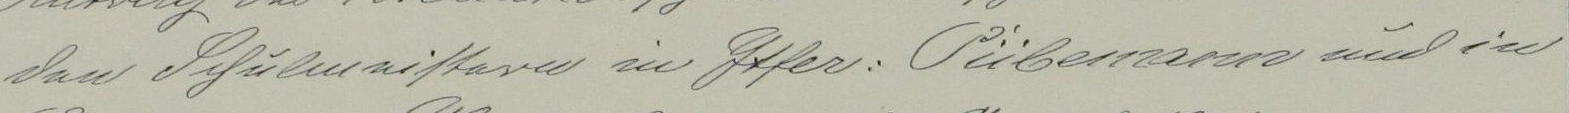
den Schulmeistern in Itfer: Piibemann und in
